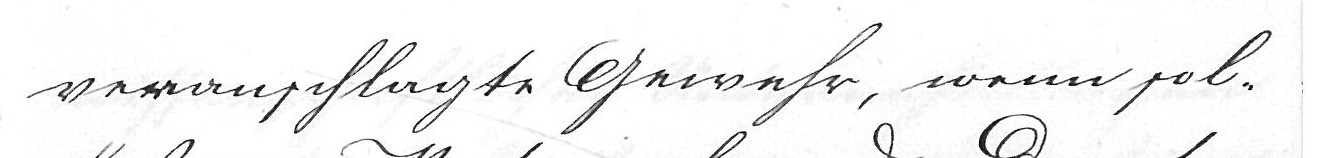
veranschlagte Gewehr, wenn sol-
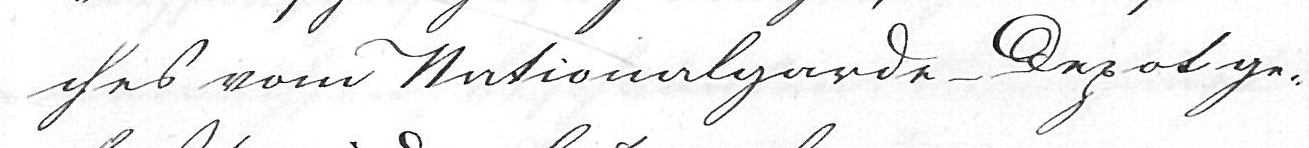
ches vom Nationalgerde-Depot ge-
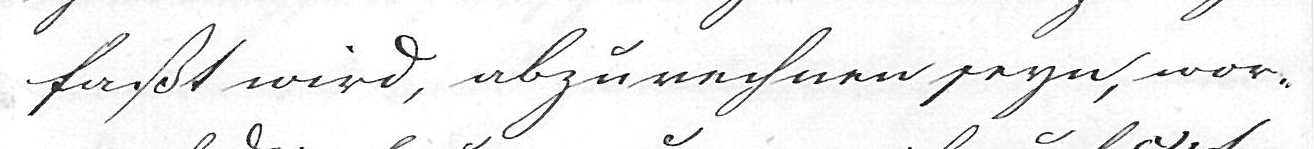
faßt wird, abzurechnen seyn, wor-
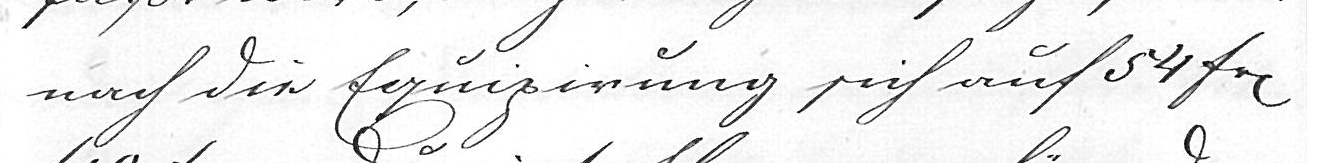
nach die Equipirung sich auch so 54 fl
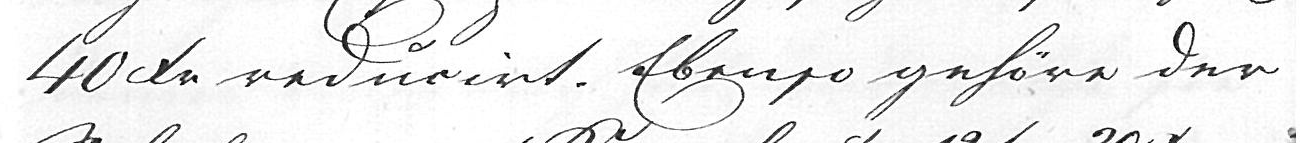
40 kr reducirt. Ebenso gehören der
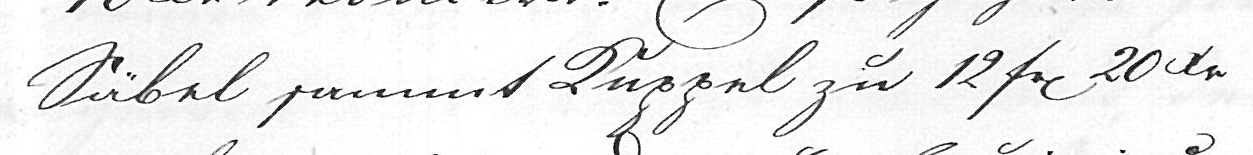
Säbel sammt Kuppel zu 12 fl 20 kr
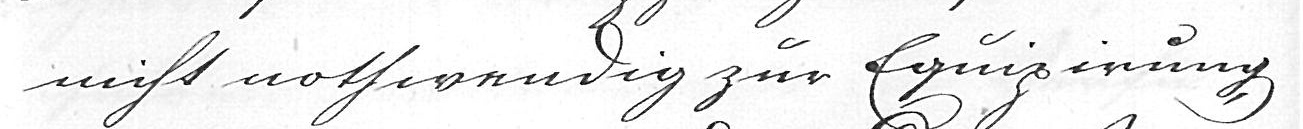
nicht nothwendig zur Equipirung
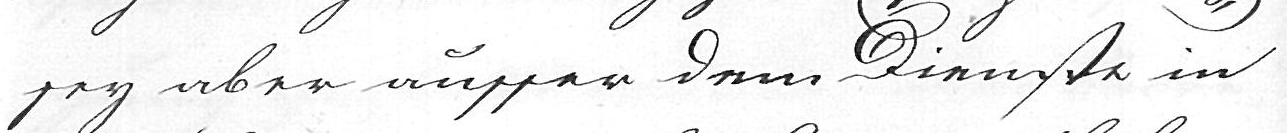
sey aber ausser dem Dienste in
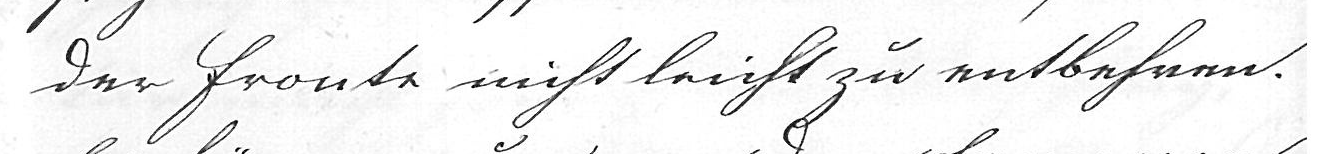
der Fronte nicht leicht zu entbehren.
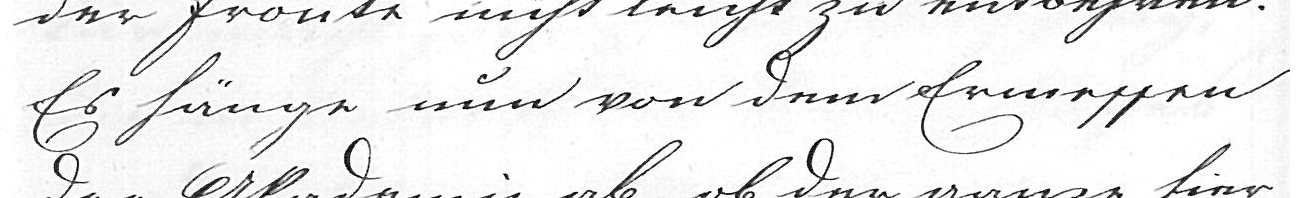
Es hänge nun von den Ermessen
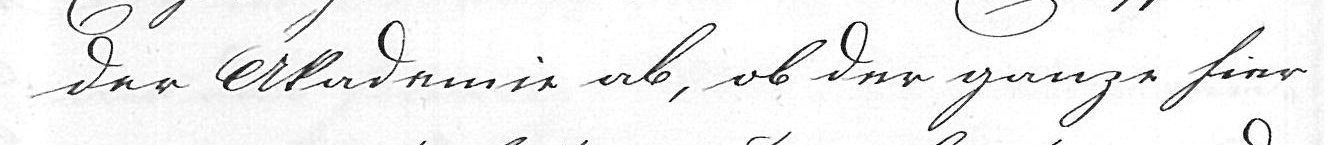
der Akademie ab, ob der ganze hier
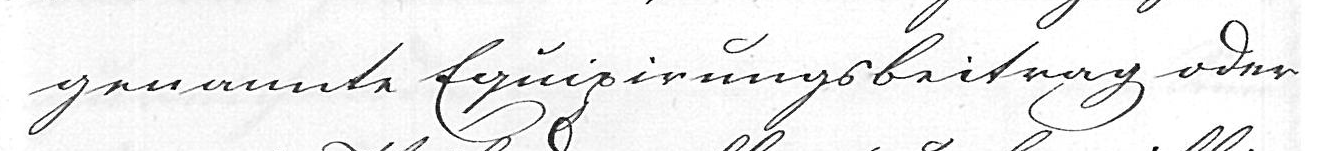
genannt Equipirungsbeitrag oder
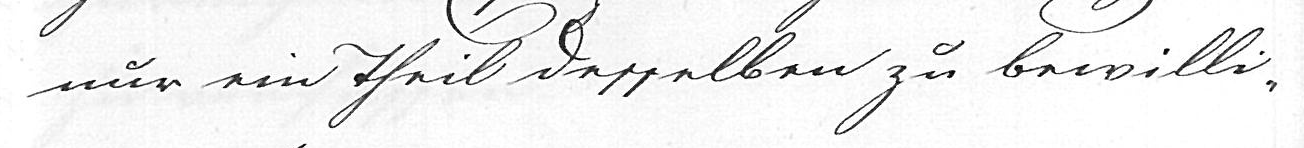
nur ein Theil desselben zu bewilli-
